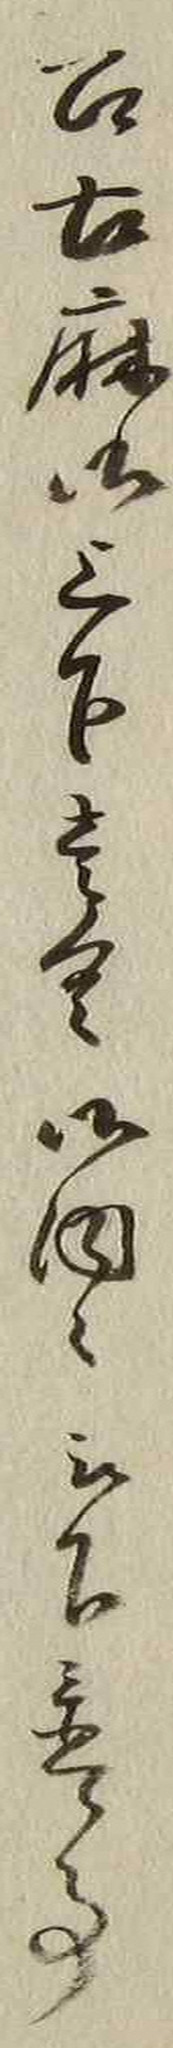召古麻御上下壱具御内々被下置候事
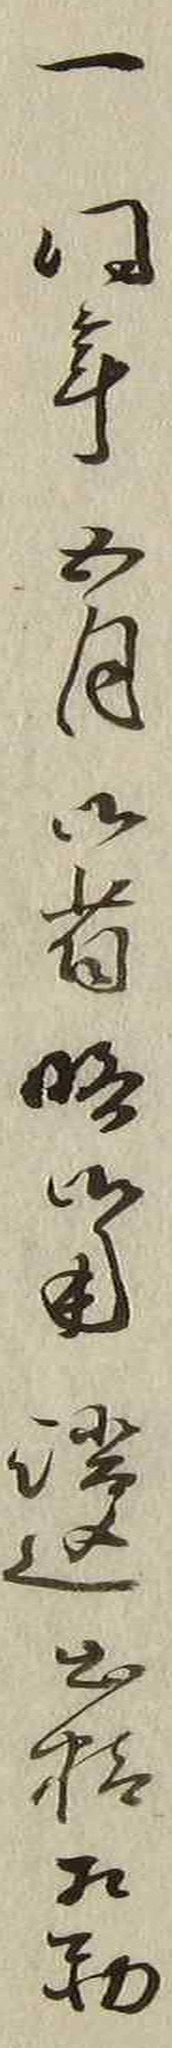一同年五月御省略御用踏込出精相勤
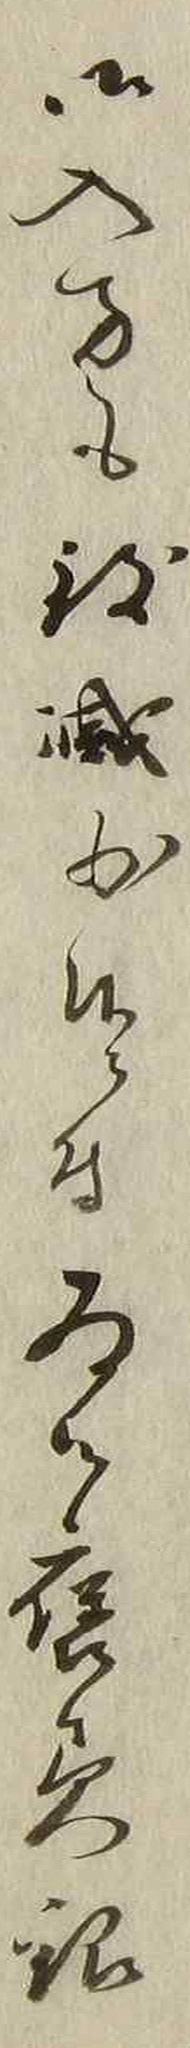御入方も致減少候ニ付為御褒美銀
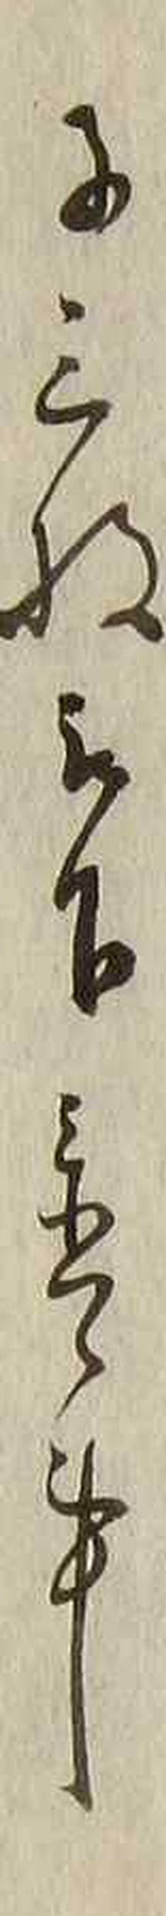子三枚被下置候事
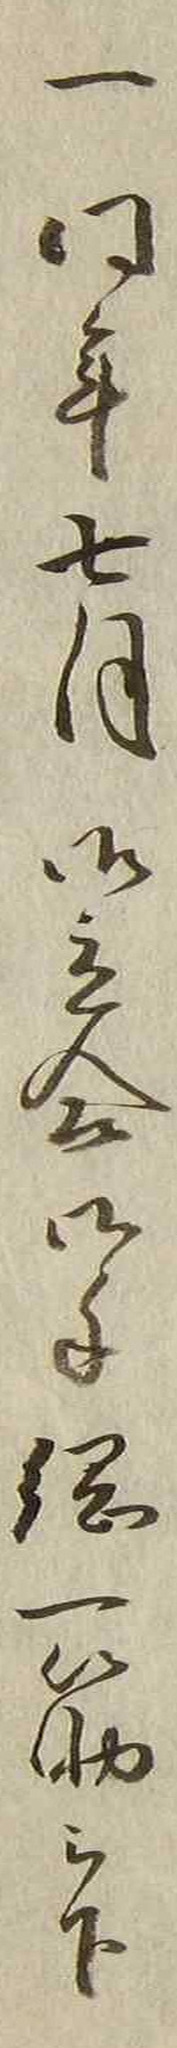一同年七月御立合御手綱一筋被下
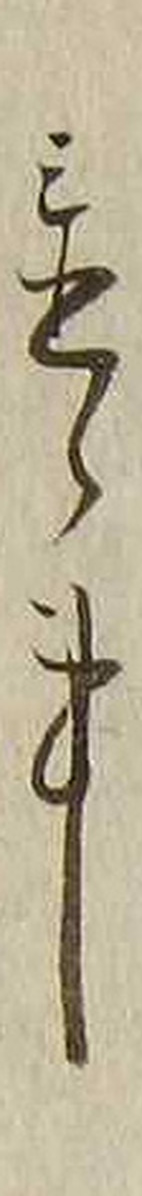置候事
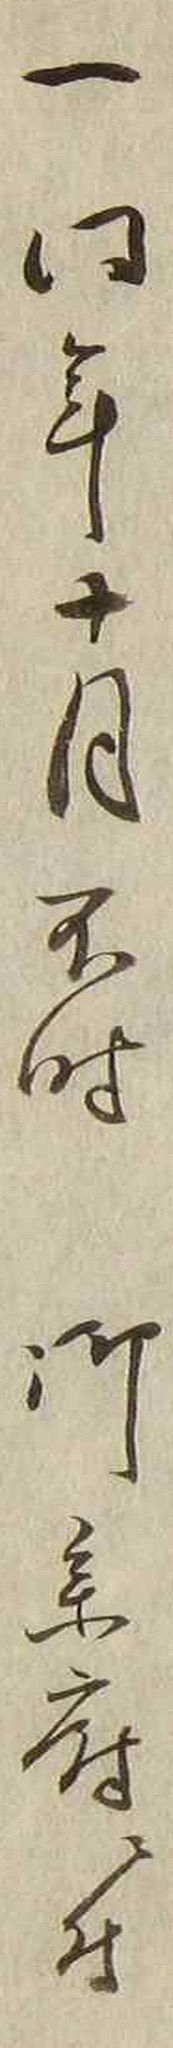一同年十月不時御参府ニ付

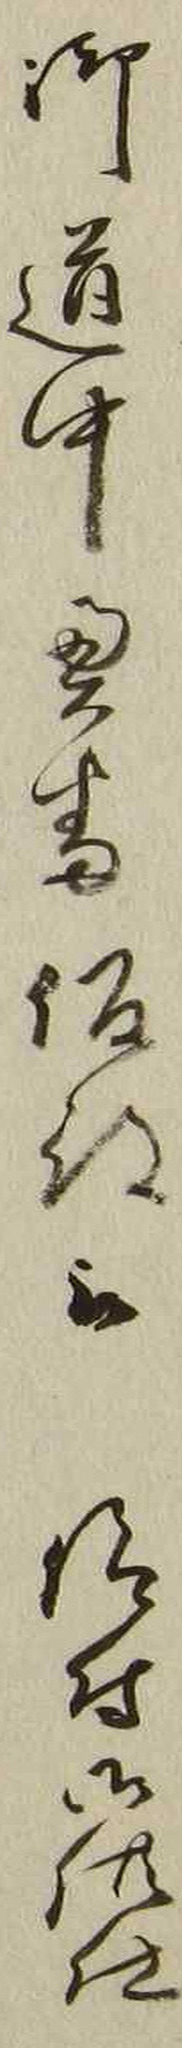御道中奥番仮役被仰付御供仕
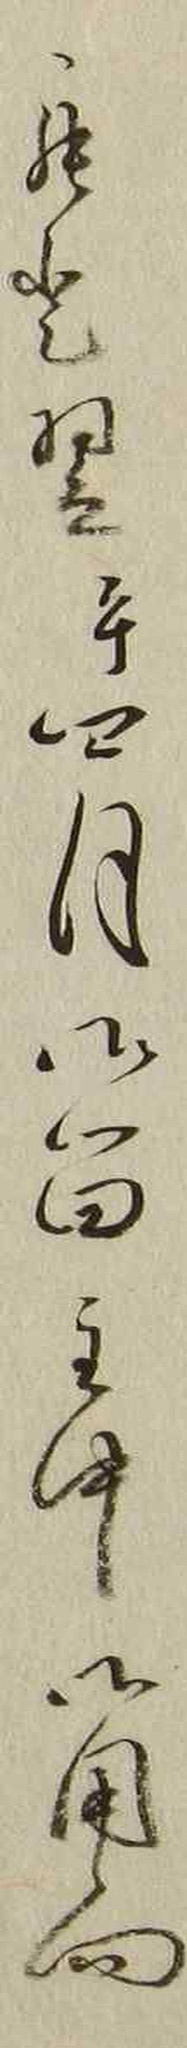罷登翌午四月御留主中御用向
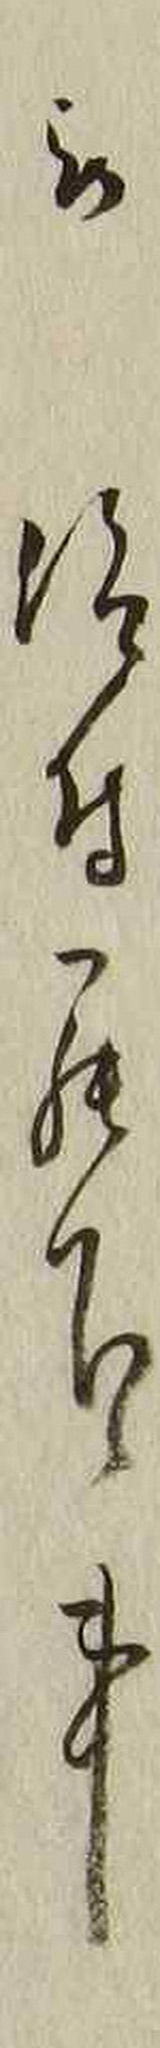被仰付罷下候事
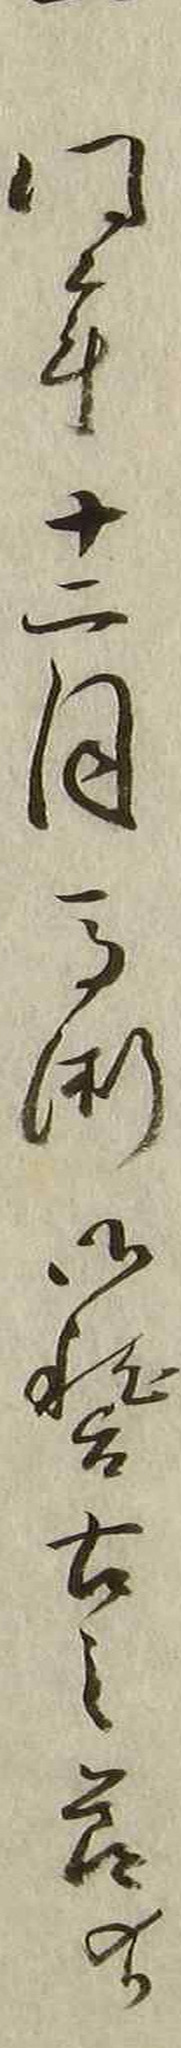一同年十二月馬術御稽古之節〆り
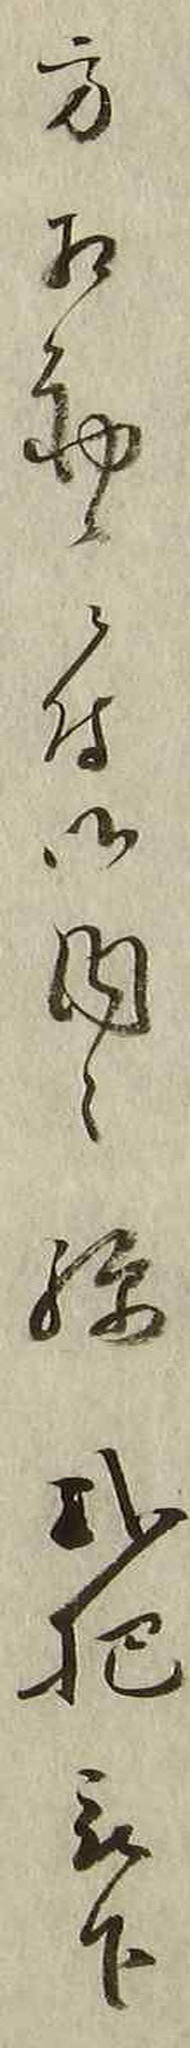方相勤候ニ付御内々綿弐把被下
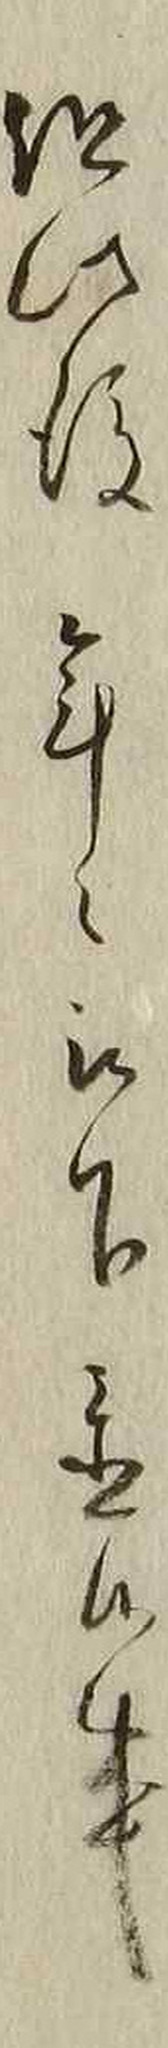但此後年々被下置候事
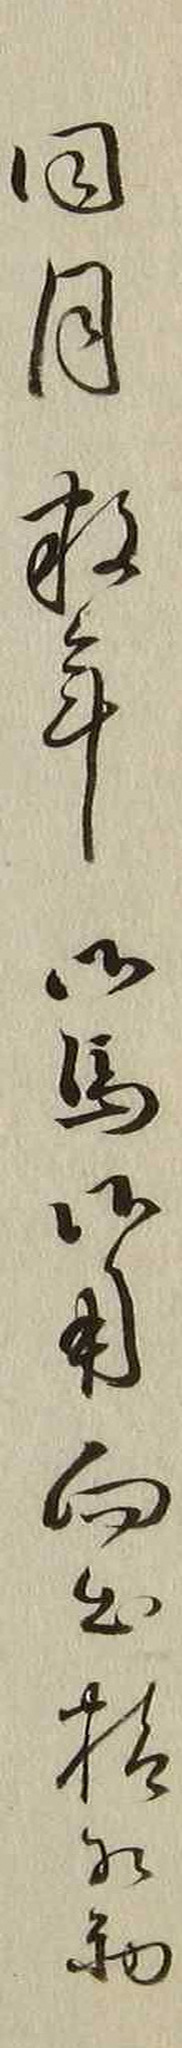一同月数年御馬御用向出精相勤
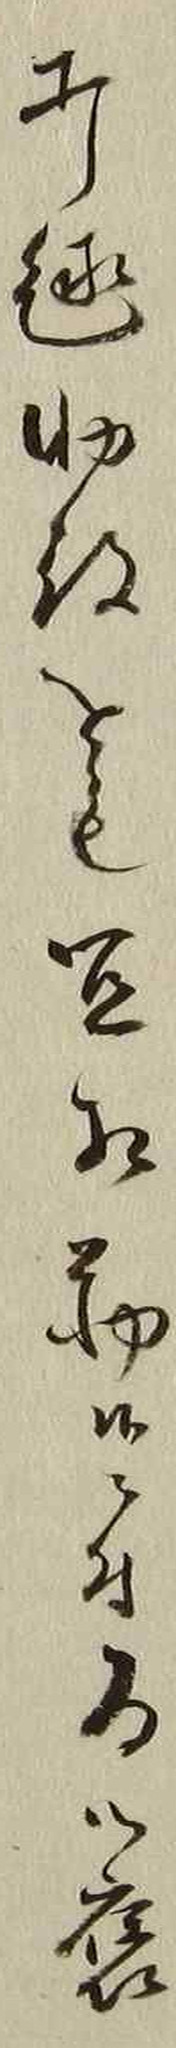打毬助役をも宜相勤候ニ付為御褒
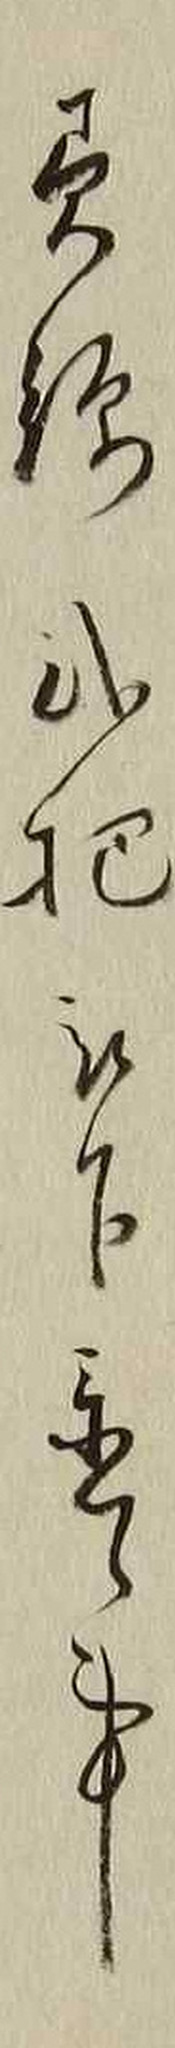美綿弐把被下置候事
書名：諸士系譜　巻之25　い之部25
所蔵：会津若松市立会津図書館
